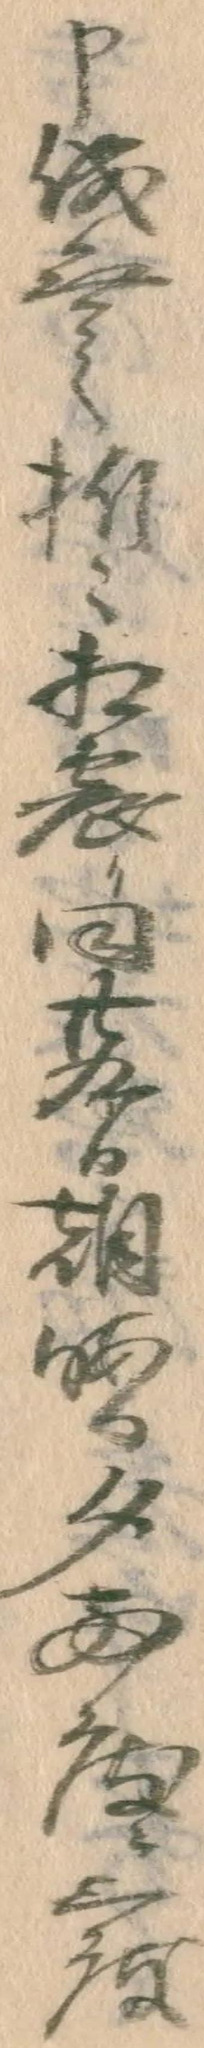申儀無之折々相震同廿九日朝晦日夕両度ニ三度
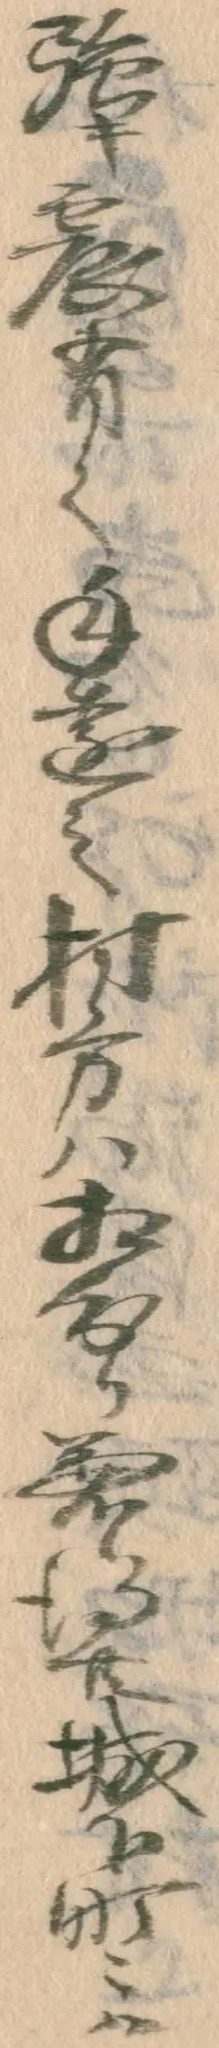強キ震有之手遠之村方ハ相分り兼候得共城下町ニハ
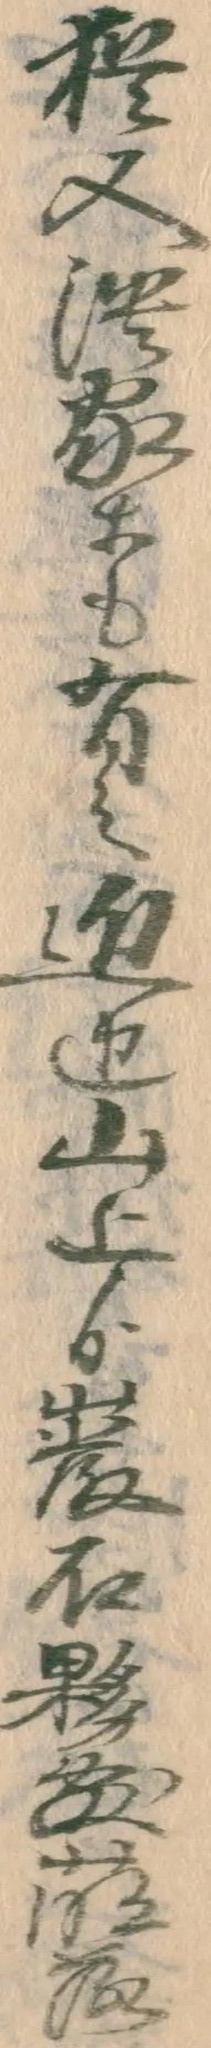猶又潰家等も在之近辺山上ゟ巌石夥敷崩落
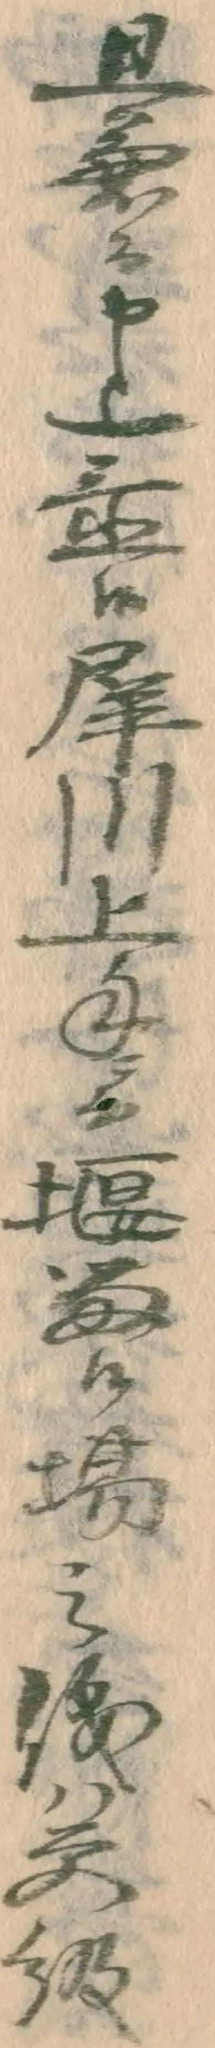且兼而申上置候犀川上手ニ而堰留候場之儀ハ更級
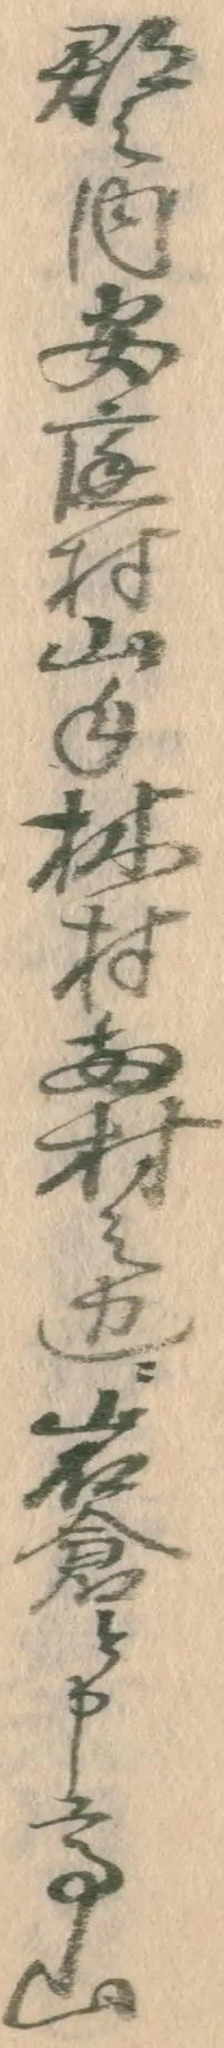郡之内安庭村山手林村両村之辺ニ岩倉山と申高山
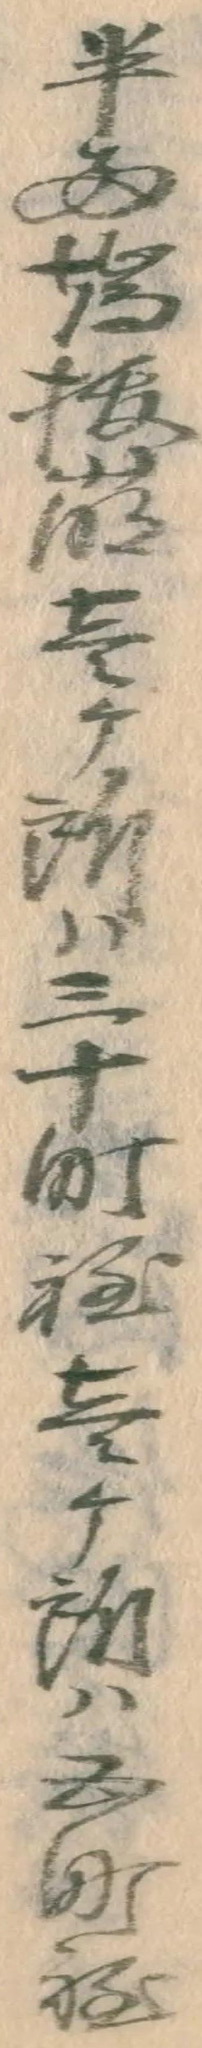半両端抜崩壱ケ所ハ三十丁程壱ケ所ハ五町程
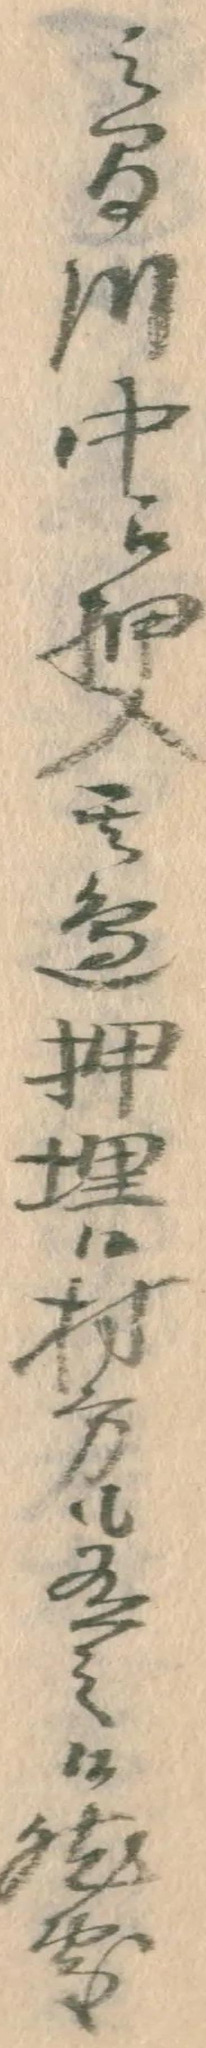之間川中江押入其辺押埋候村方も有之候然処
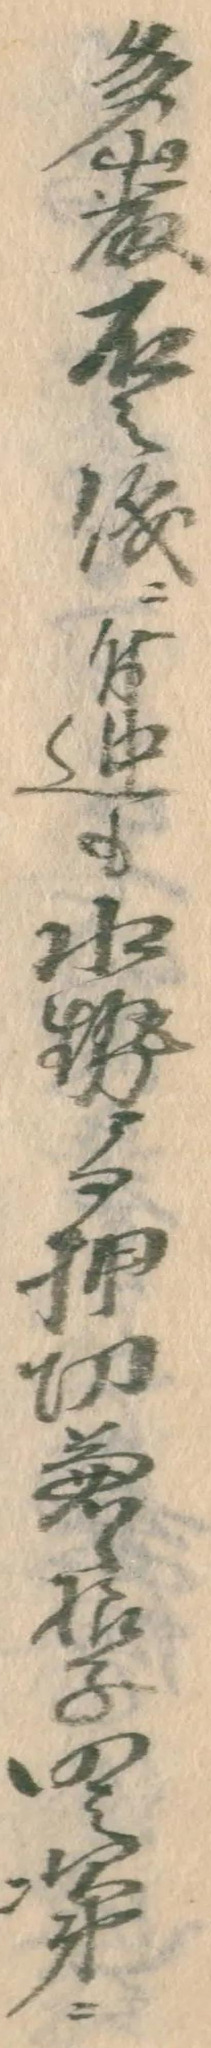多巌石之儀ニ付迚も水勢ニ而押切兼候様子之次第ニ
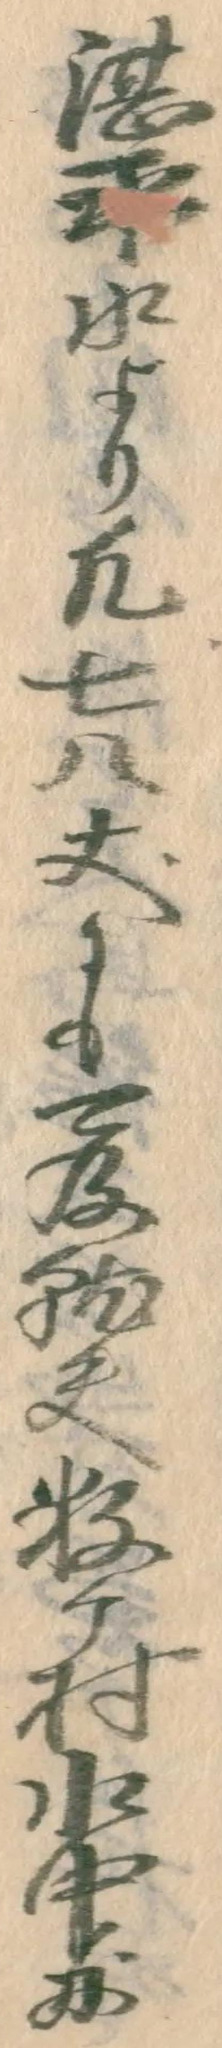湛平水より凡七八丈ニも可及就夫数ケ村水中に
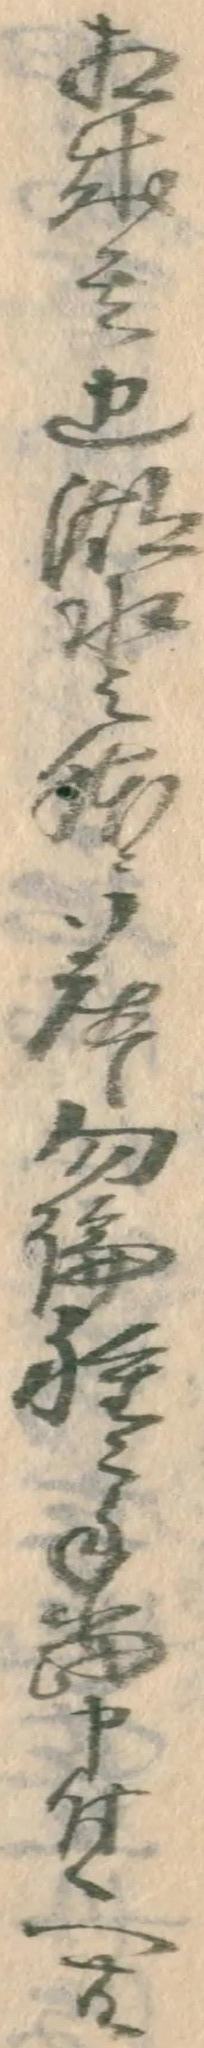相成其辺潮水之躰ニ御座候勿論種々手当申付候へ共
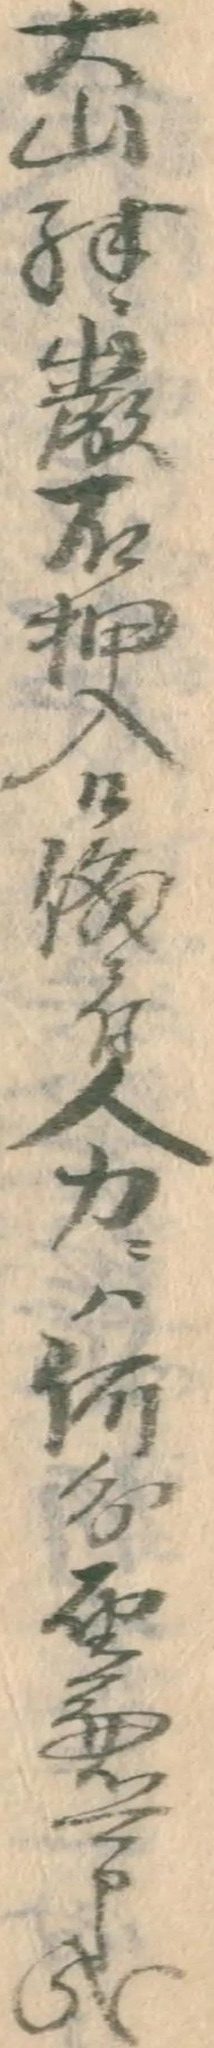大山殊ニ巌石押入候儀ニ付人力ニハ何分届兼可申哉

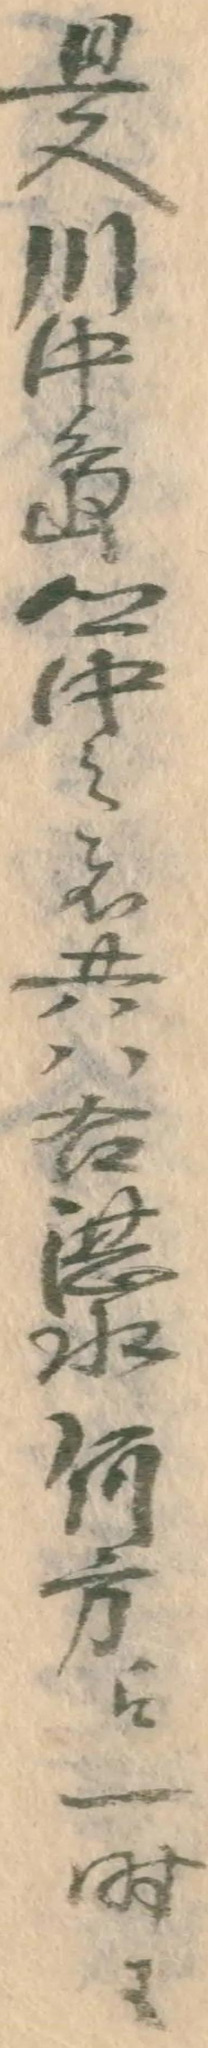且又川中島郷中之者共ハ右湛水何方江一時に
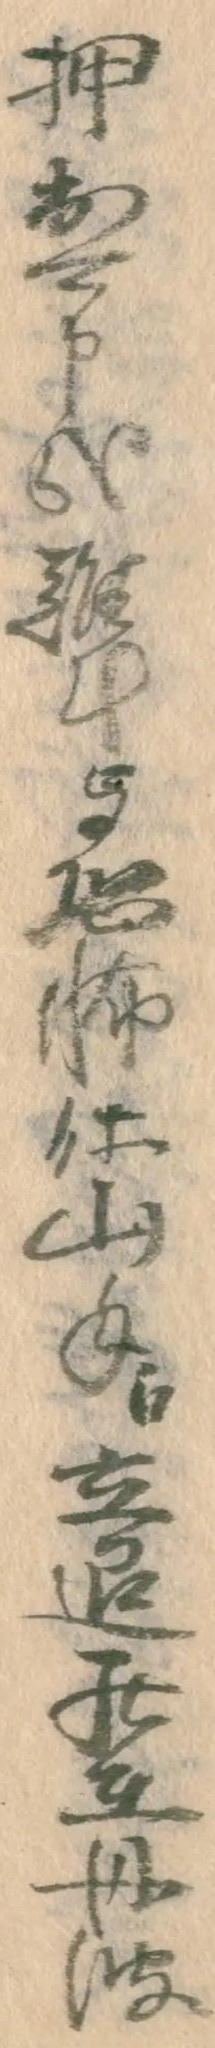押出可申哉難計と恐怖仕山之手江立退罷在丹波
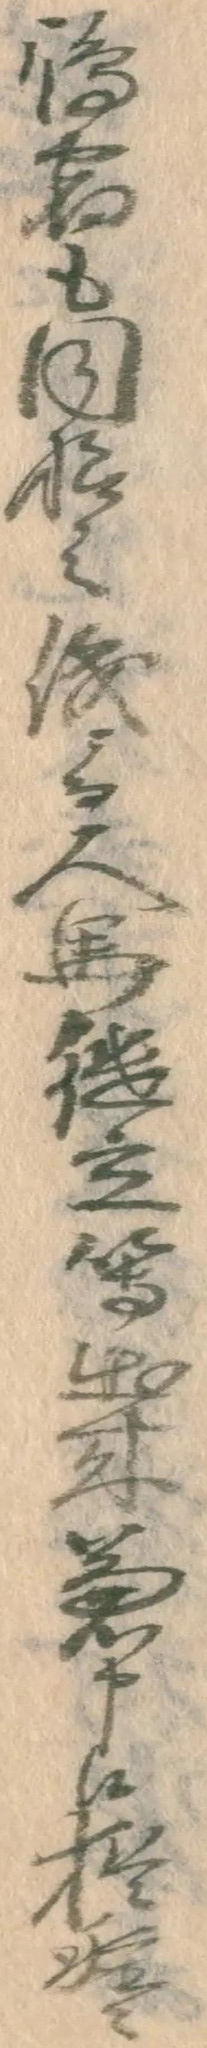島宿等も同様之儀ニ而人馬継立等出来兼申候猶益々
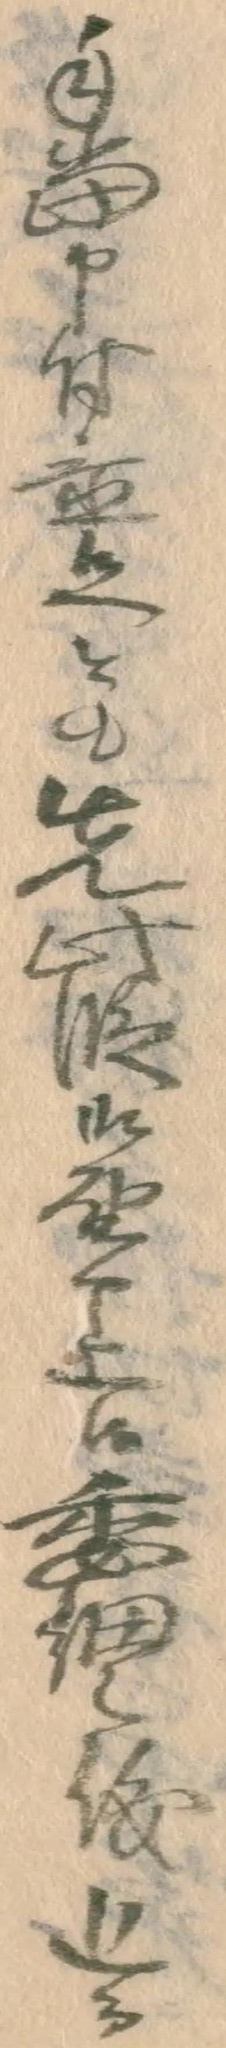手当申付置候へとも先此段御届申上候委細之儀追而
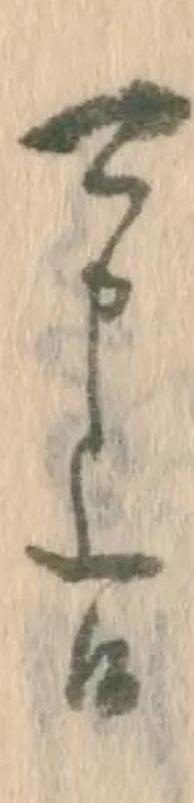可申上候
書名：信州大地震之記
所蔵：国立国会図書館 National Diet Library, JAPAN
